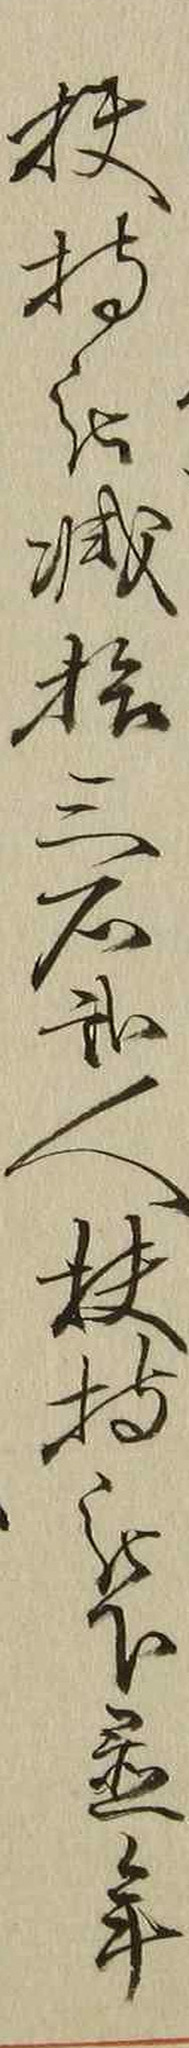扶持被減拾三石弐人扶持被下置年
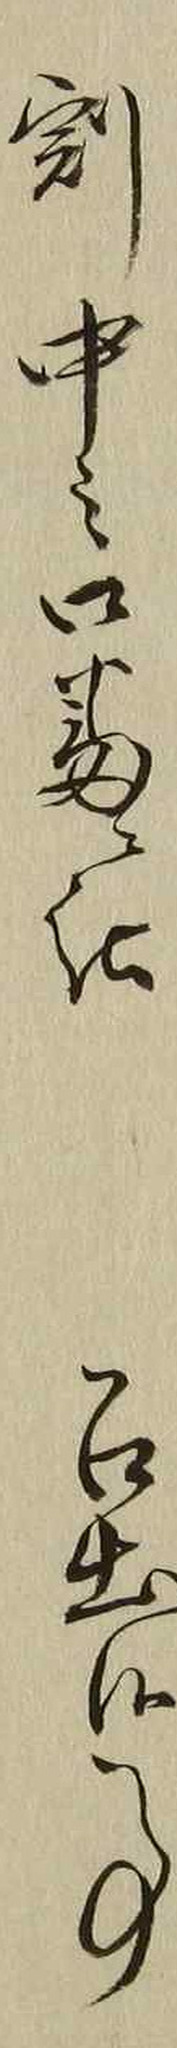割中之口番ニ被召出候事
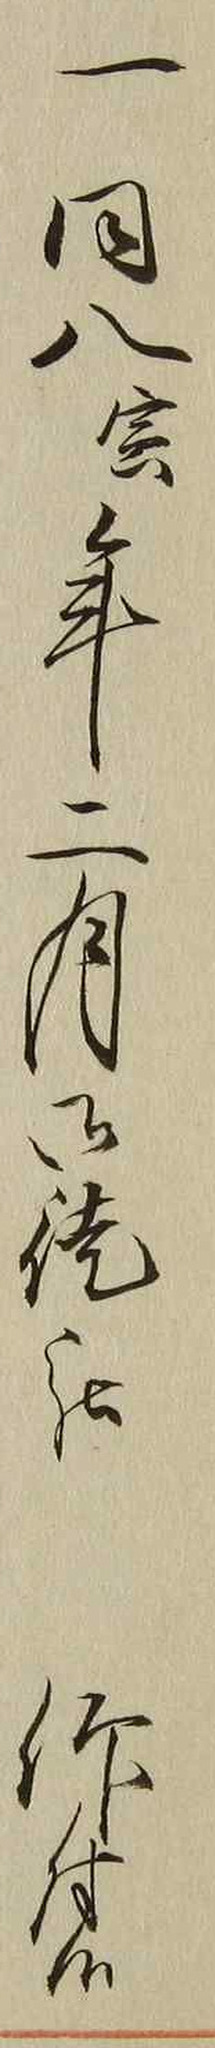一同八寅年二月御徒被仰付候
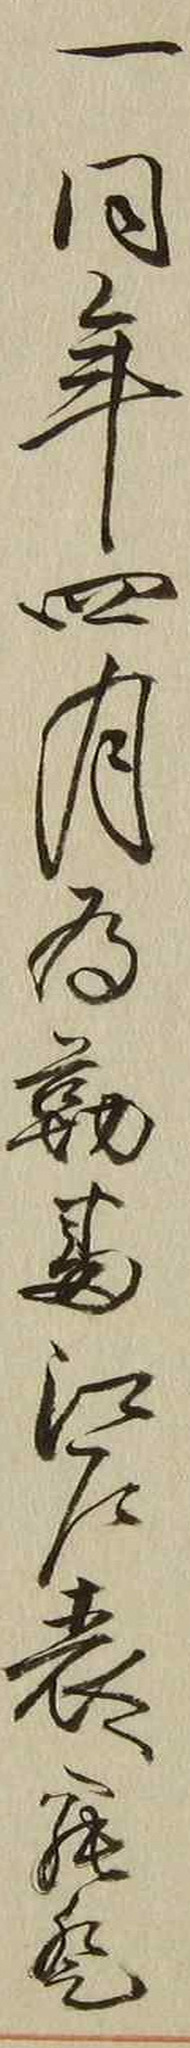一同年四月為勤番江戸表へ罷登
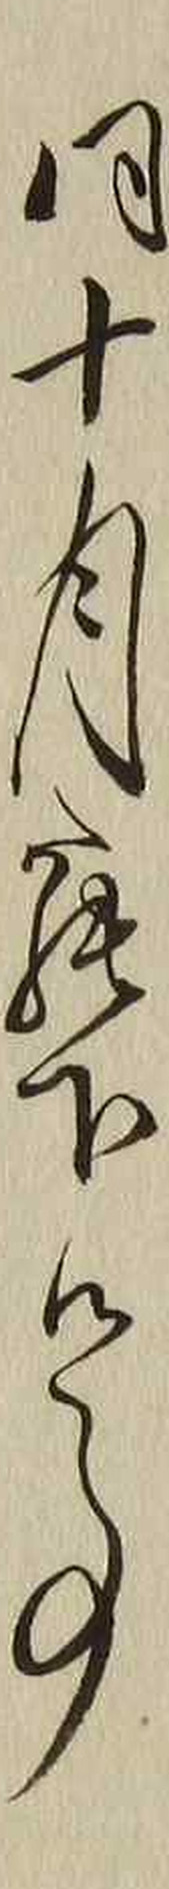同十月罷下候事
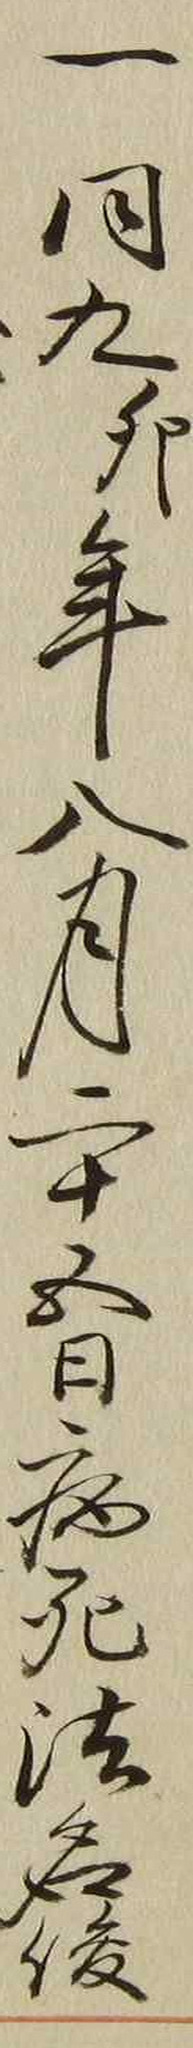一同九卯年八月二十五日病死法名俊
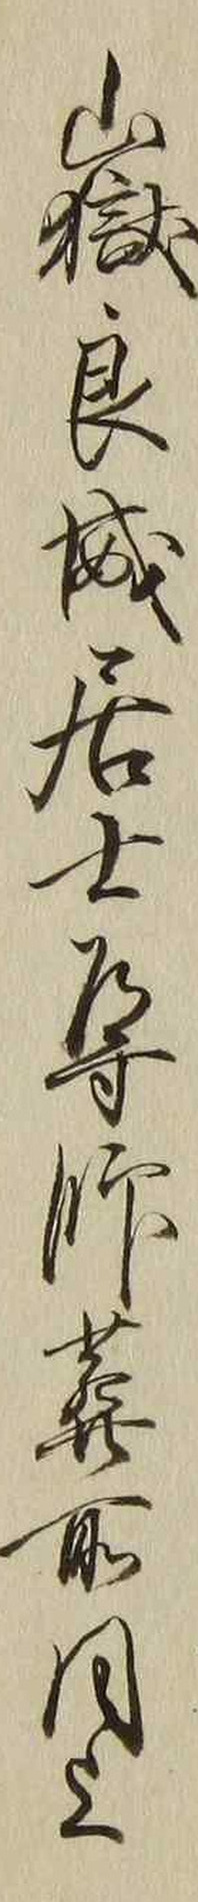嶽良威居士導師葬所同上
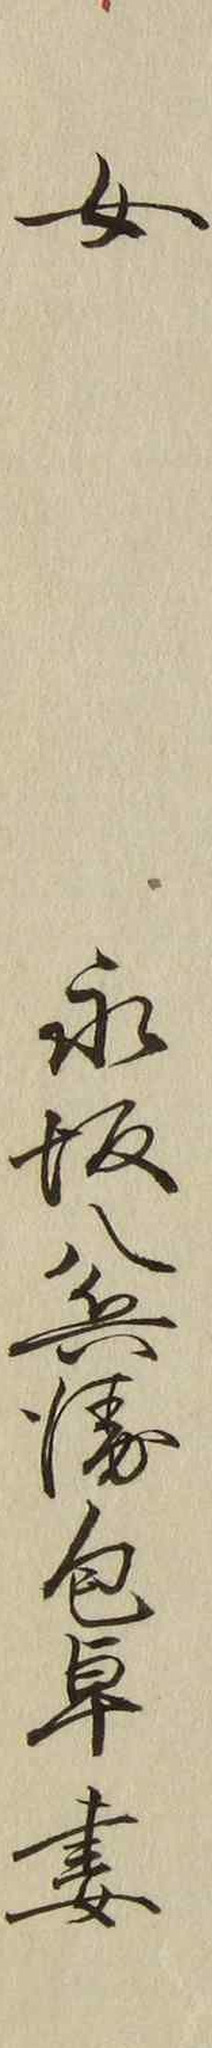女永坂八兵衛包卓妻
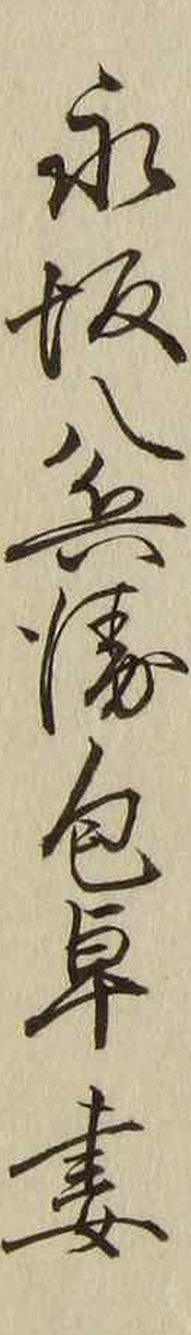女永坂八兵衛包卓妻
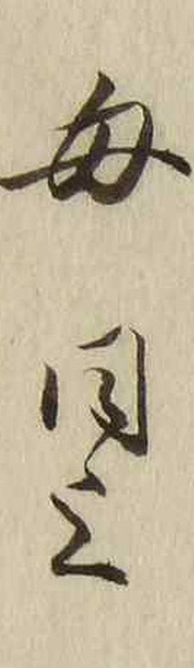母同上

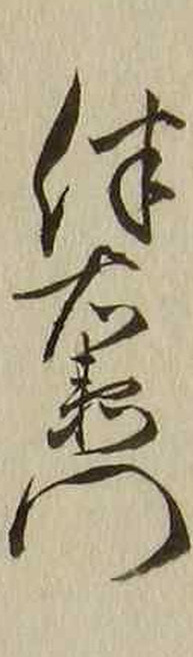伴右衛門
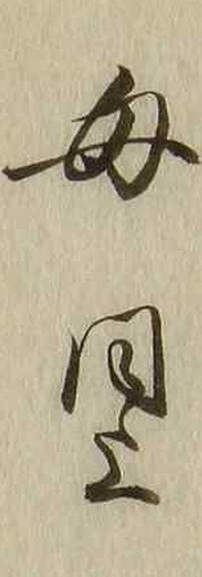母同上
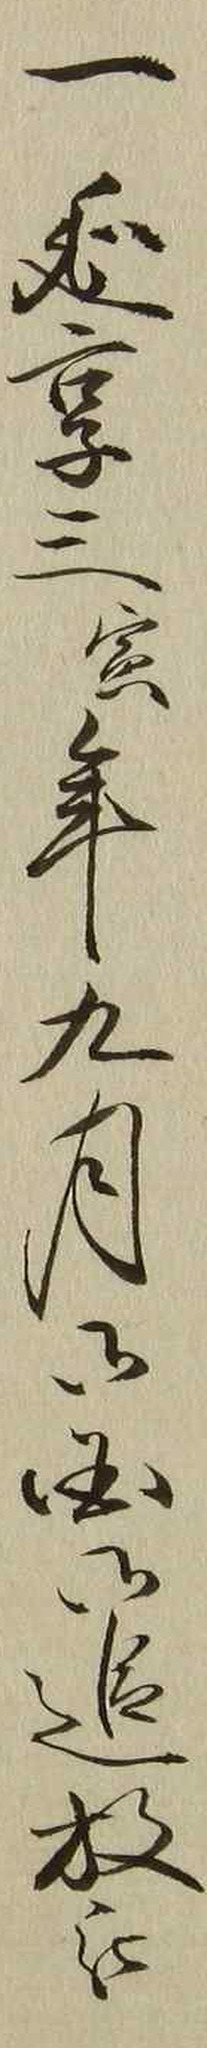一延享三寅年九月御国御追放被
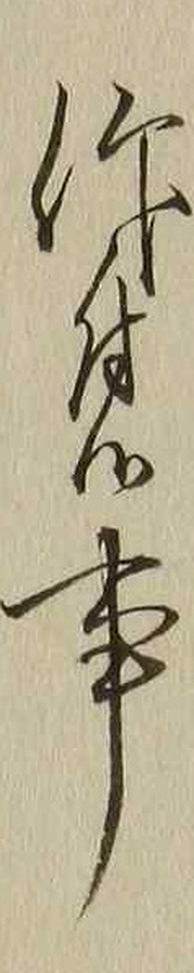仰付候事
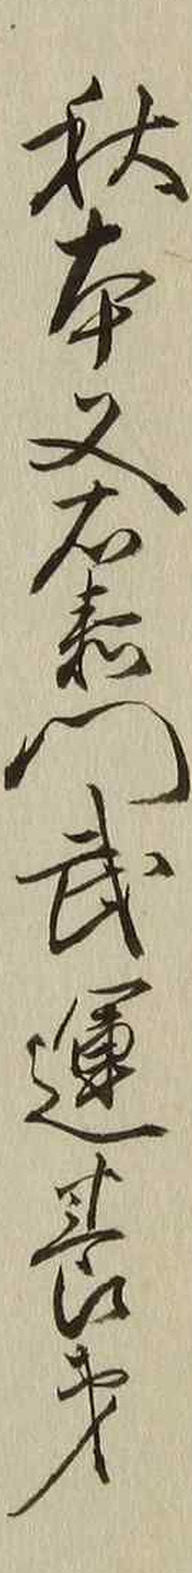秋本又右衛門武運養弟
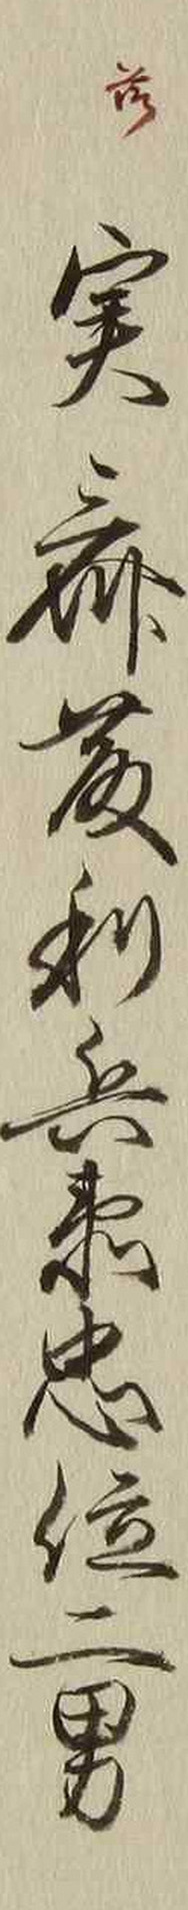実斎藤利兵衛忠位二男
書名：諸士系譜　巻之57　ほ之部4
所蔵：会津若松市立会津図書館
